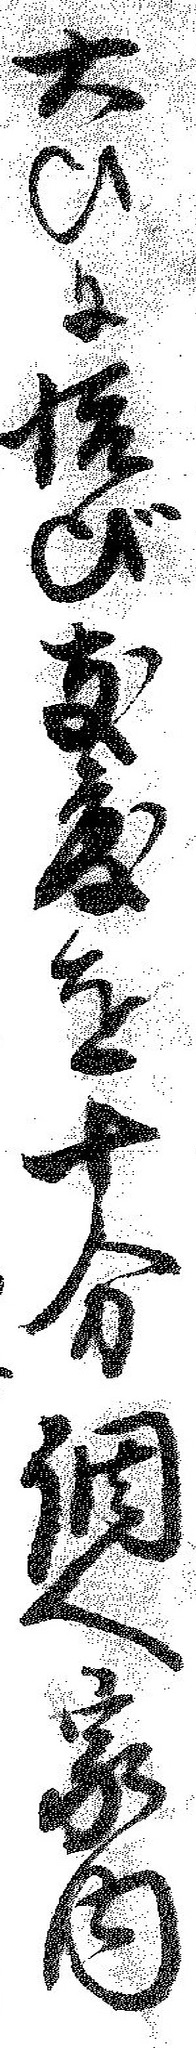大ひに悦び支度を十分調へ家内
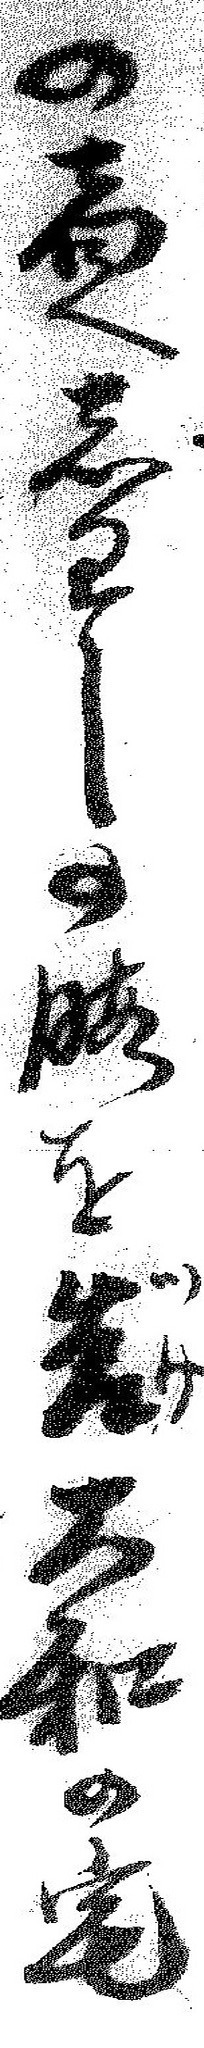の者へしわしの暇を告大和の宅
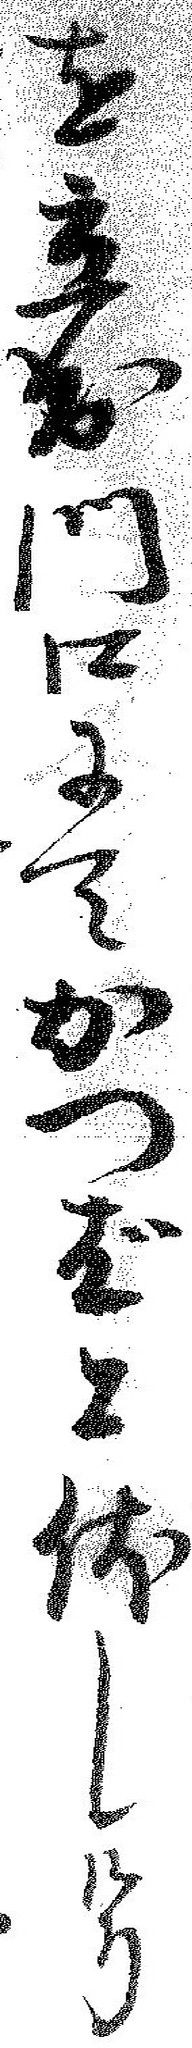を立出門口にてかつばと伏しけり
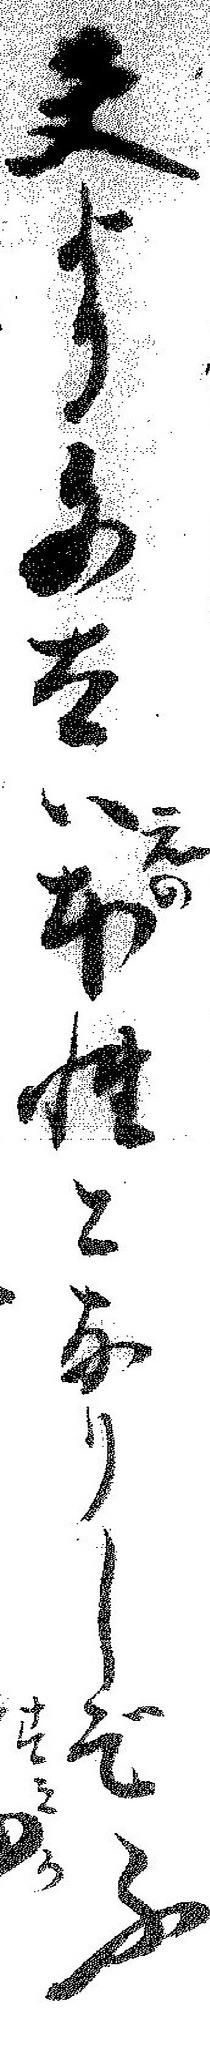夫より千吉は元の本性となりしぞ不
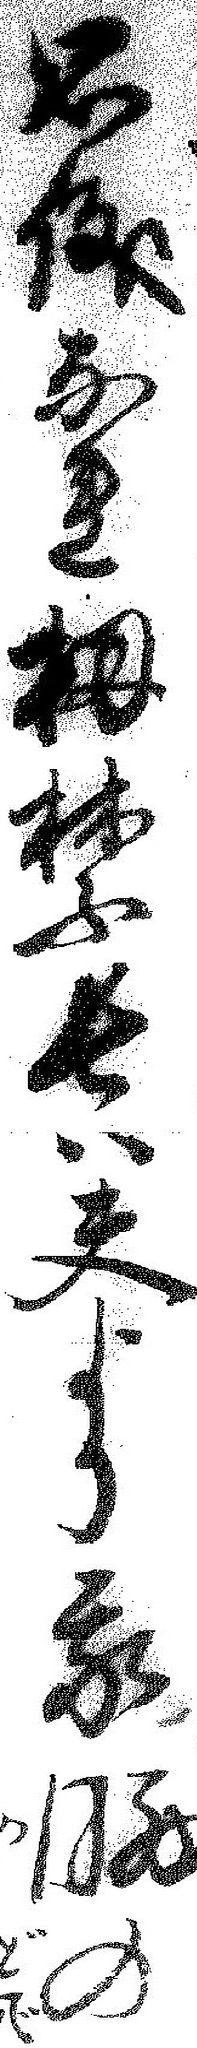思議なれ扨禁長は夫より我晒の
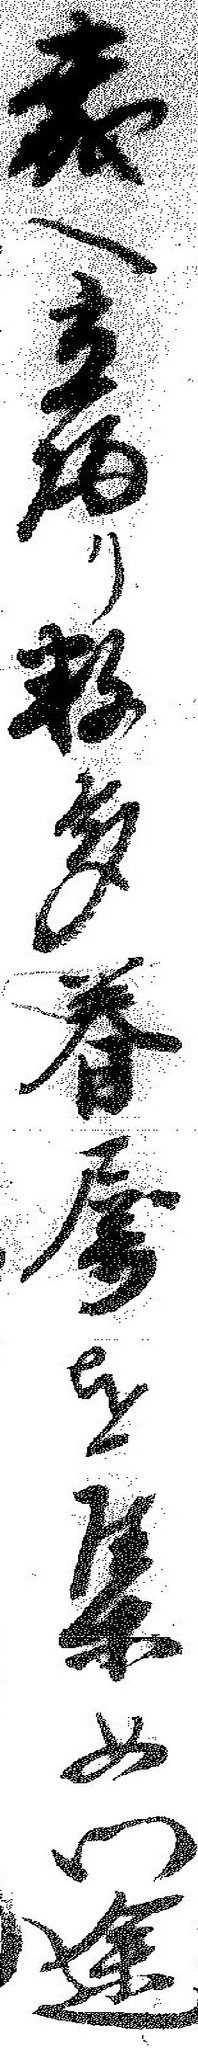森へ立帰り数多眷属を集め門途
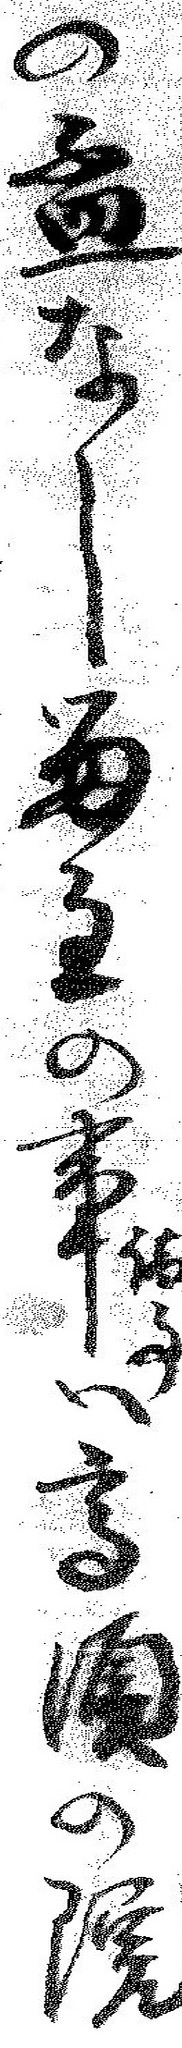の盃なし留主の事諸事は高須の院
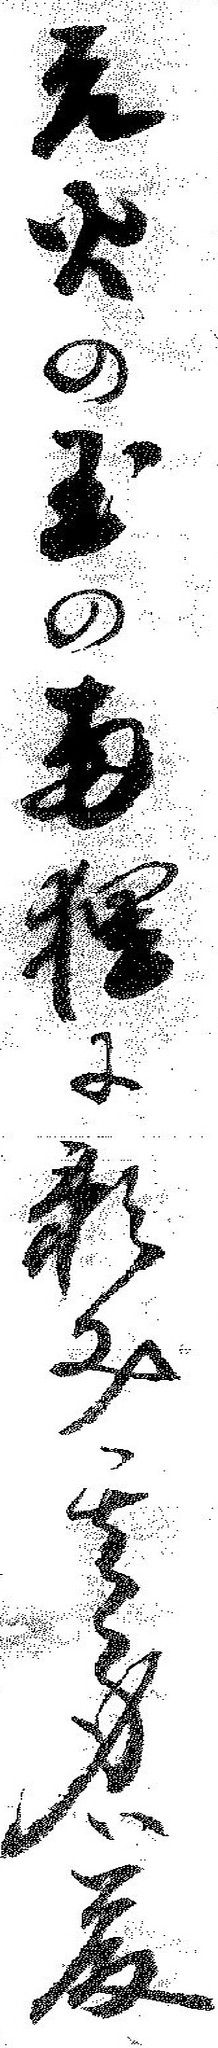元火の玉の両狸に頼み其身は藤
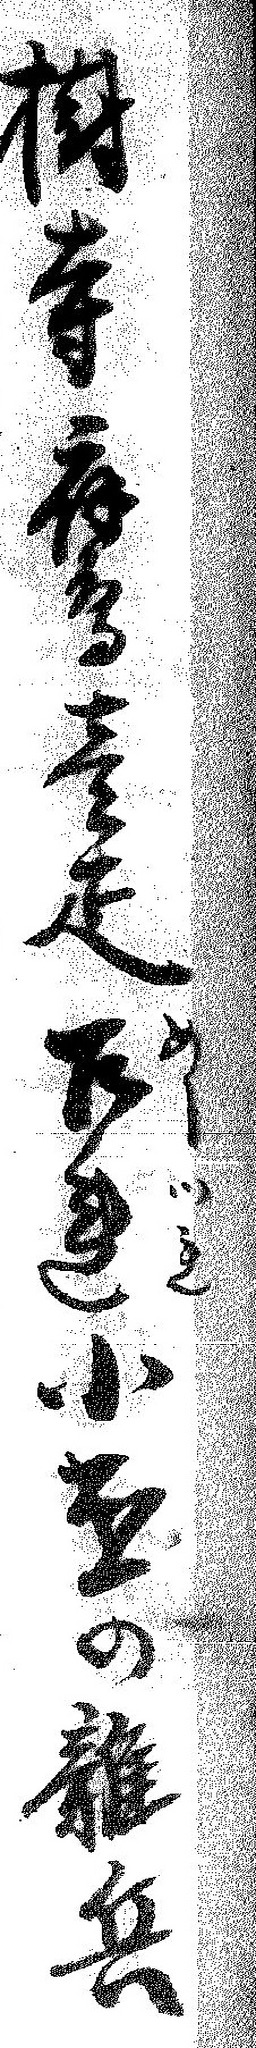樹寺鷹一疋召連小遣の雑兵
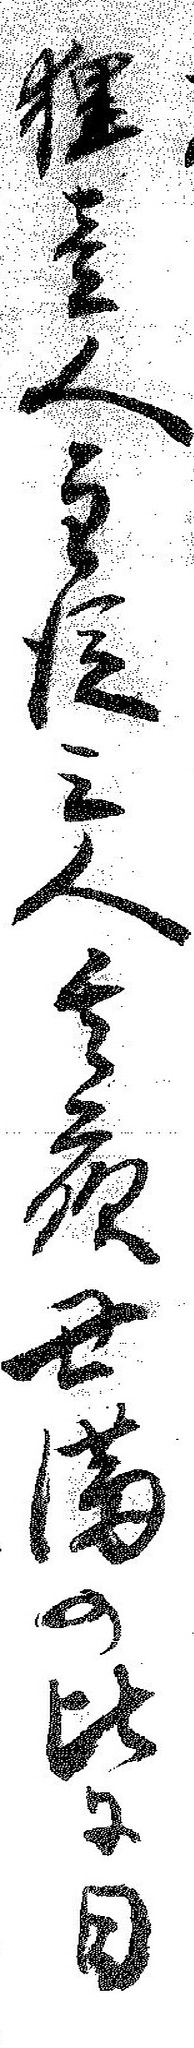狸壱人主従三人其夜丑満の比に日
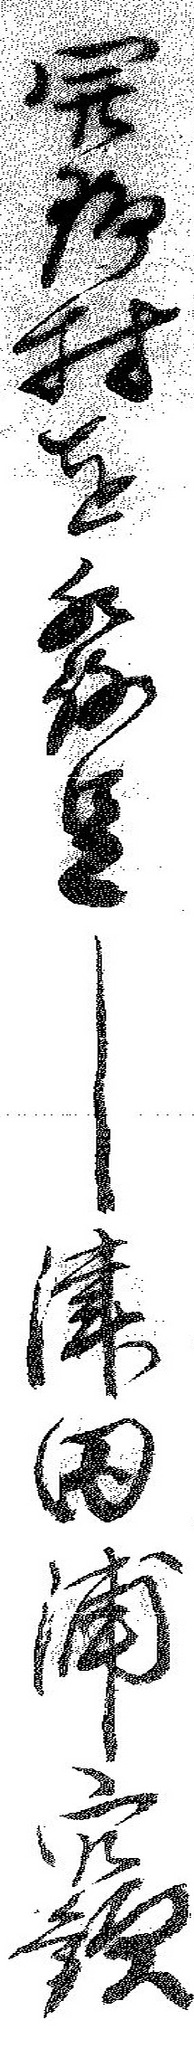開野村を発足し津田浦穴観
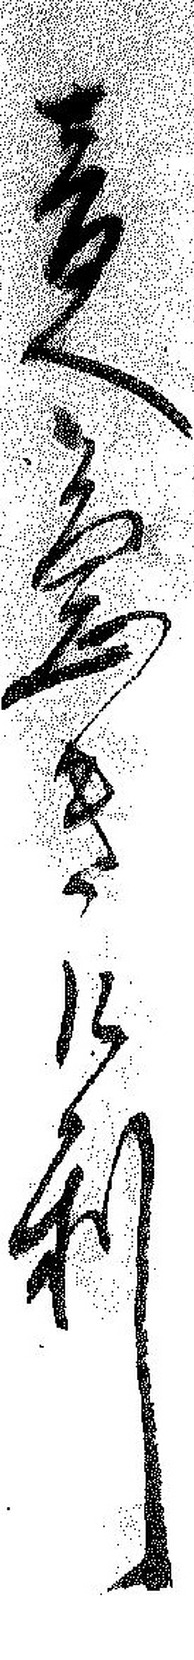音へ急きけり
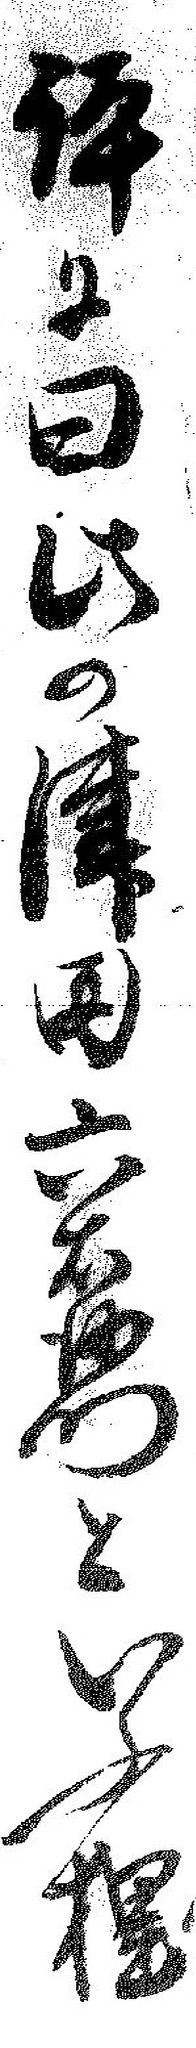評に曰此の津田六右衛門といふ狸
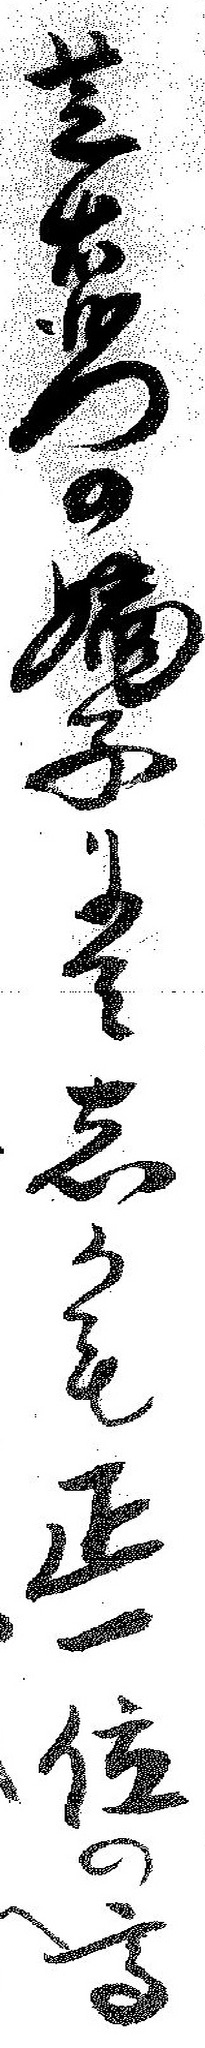芝右衛門の嫡子にてしかも正一位の高
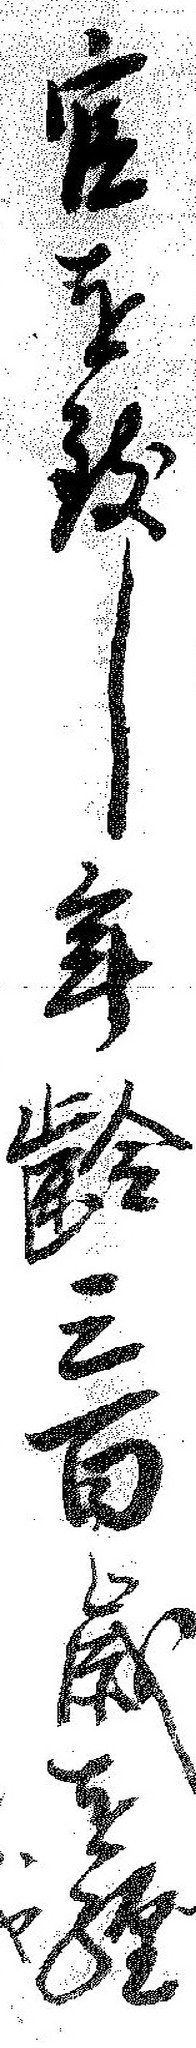官を致し年齢三百歳を経
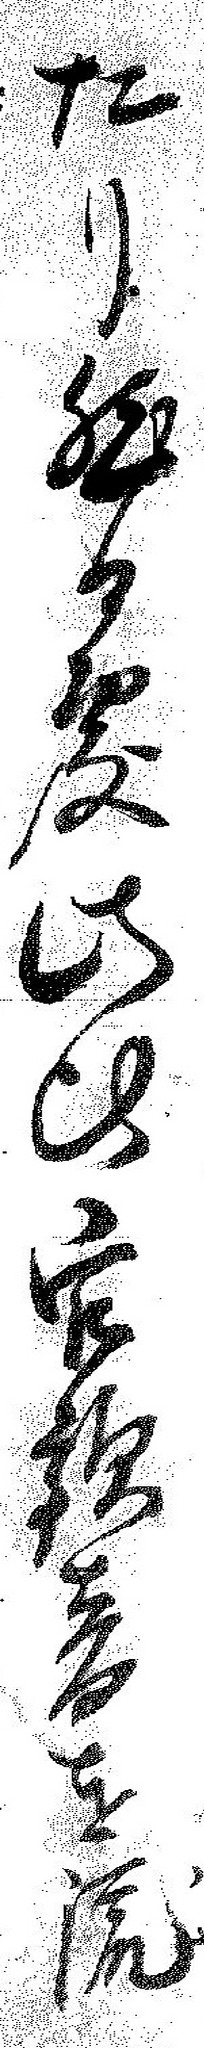たり然る処此頃穴観音を流
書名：近頃古狸珍説　礼義智信
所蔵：徳島県立図書館
